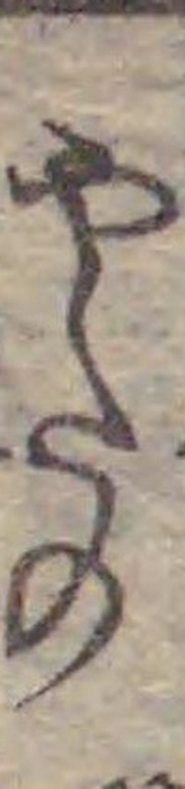やたの
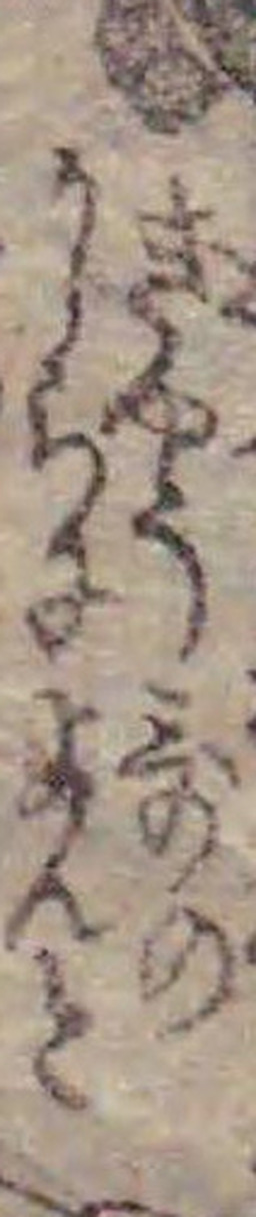かしらによんと
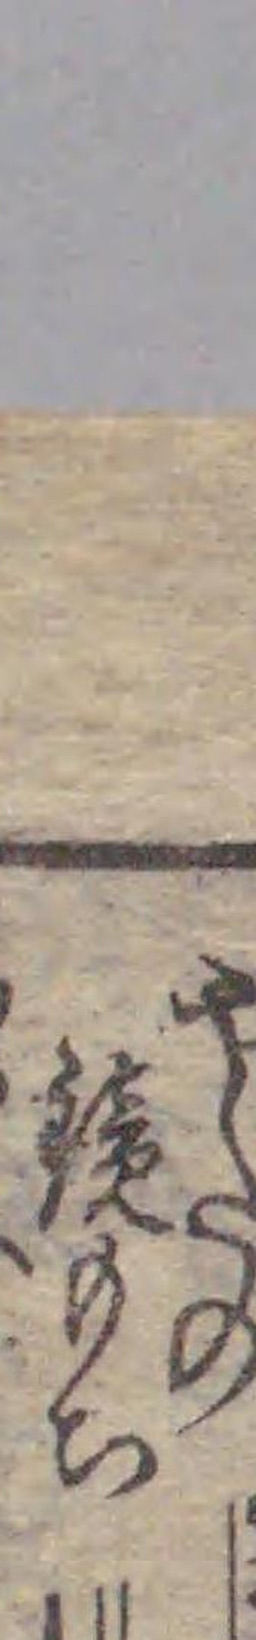鏡もち
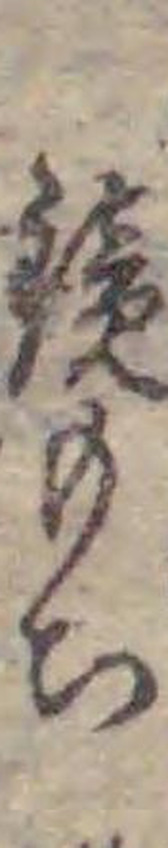鏡もち
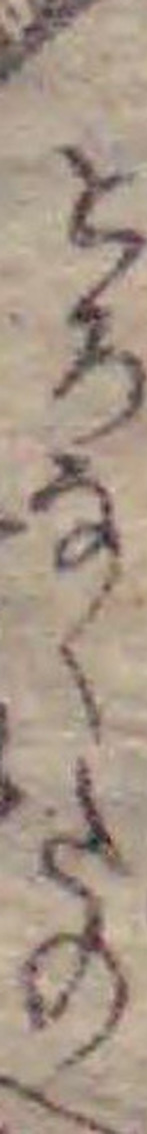ころなくたの
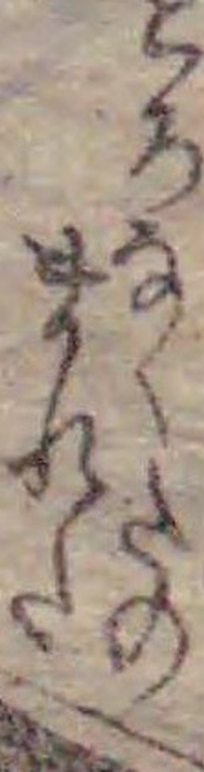まれた
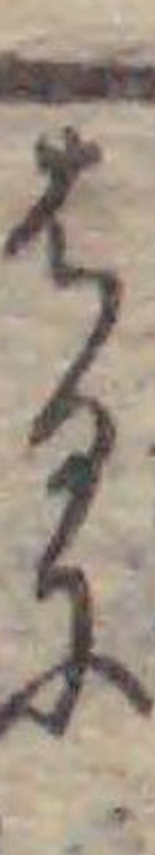はるに
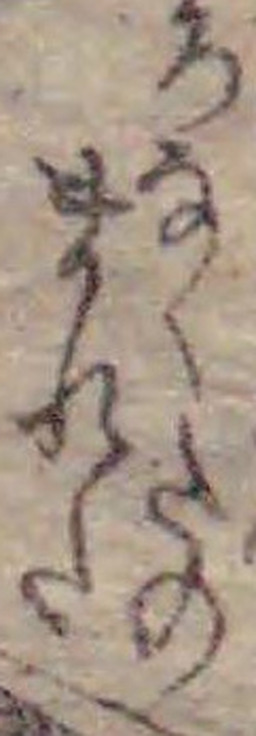まれた
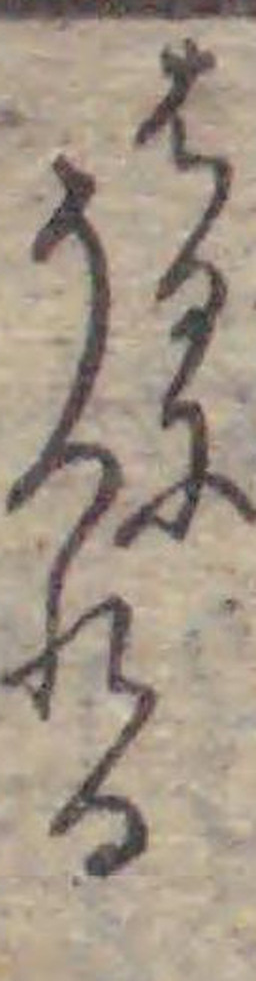うつれる
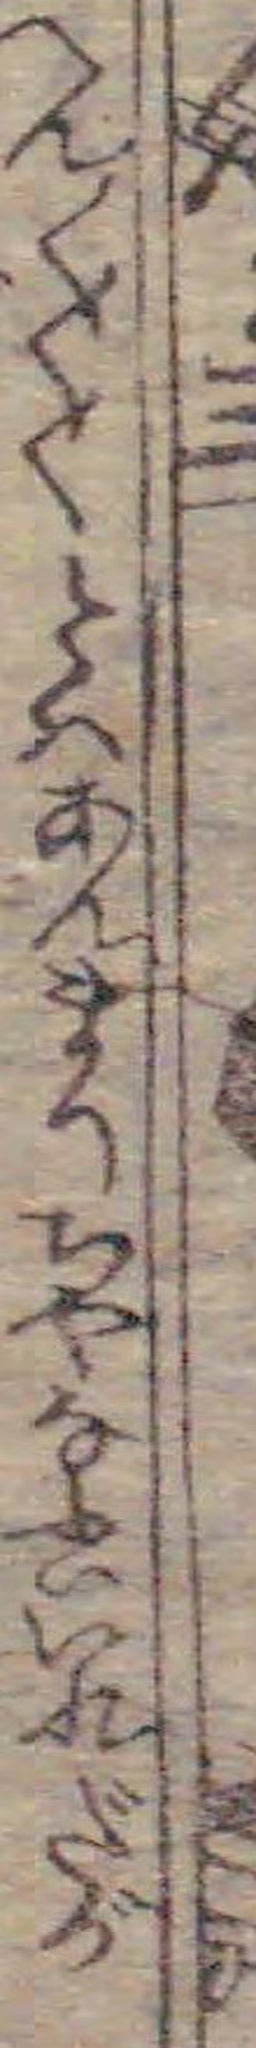へん〳〵〳〵〳〵とはあんまりちやな書いれだが
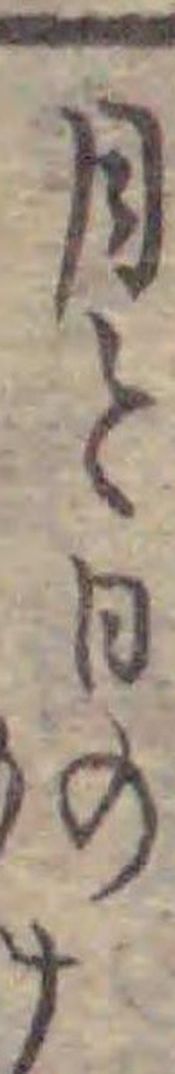月と日の
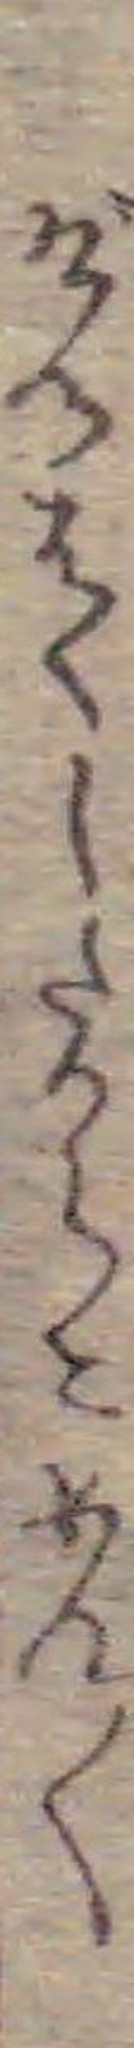げつはくしたからこめん〳〵

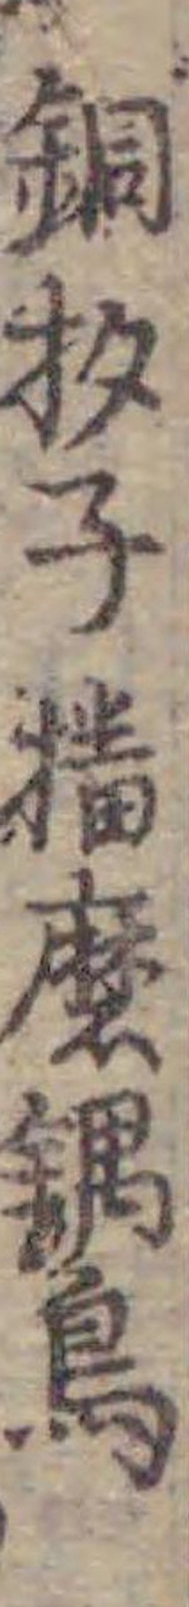銅杓子播麿鍋鳥
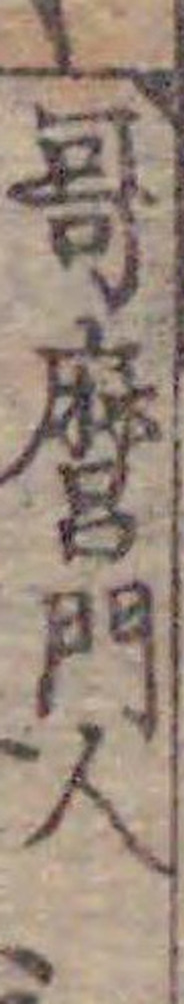歌麿門人
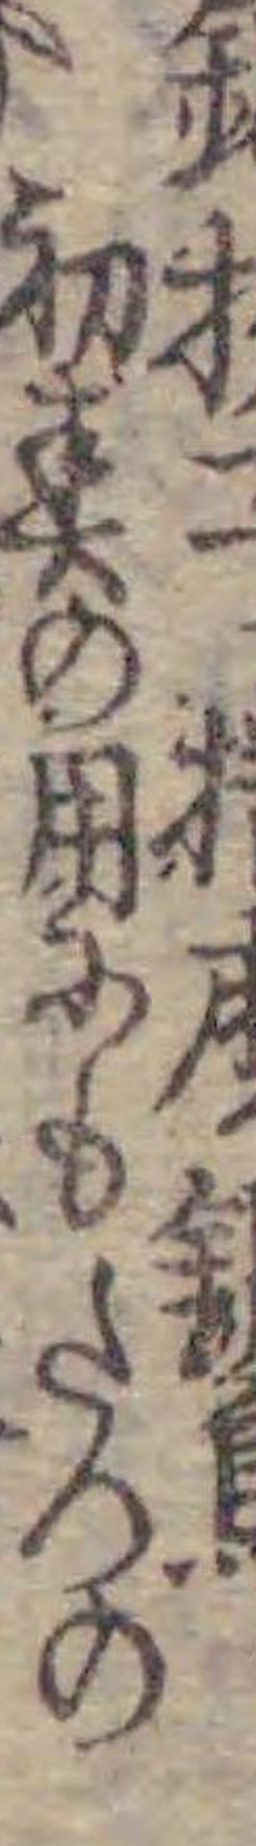初春の用にもたつの
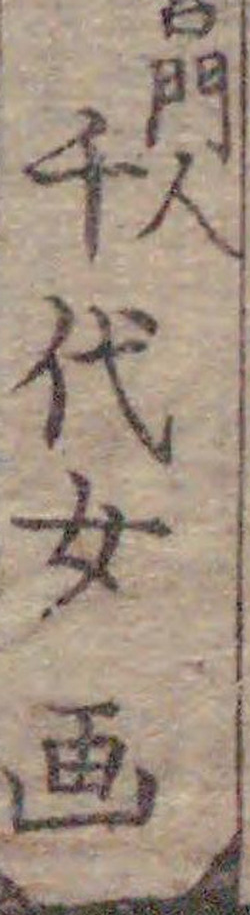千代女画
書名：年始御礼帳 : 3巻
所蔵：国立国会図書館 National Diet Library, JAPAN
